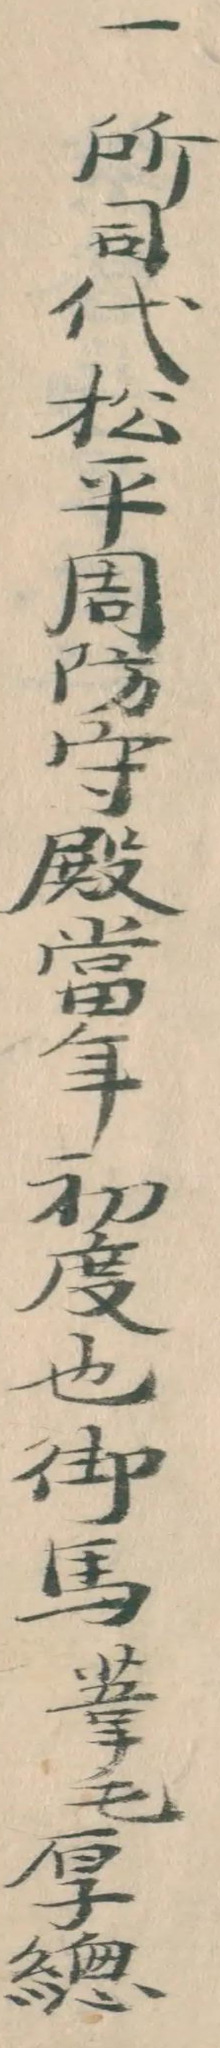一所司代松平周防守殿当年初度也御馬葦毛厚総

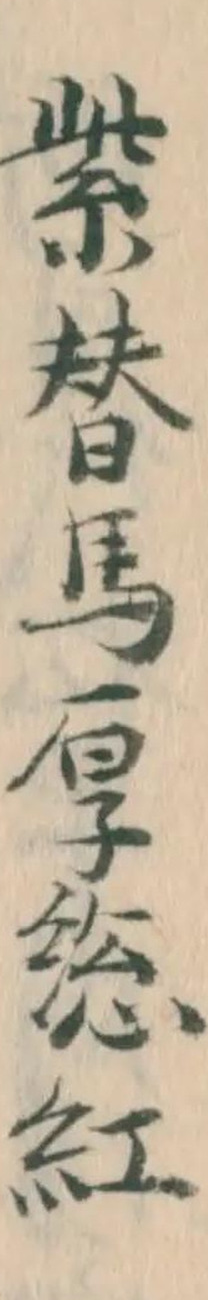紫替馬厚総紅
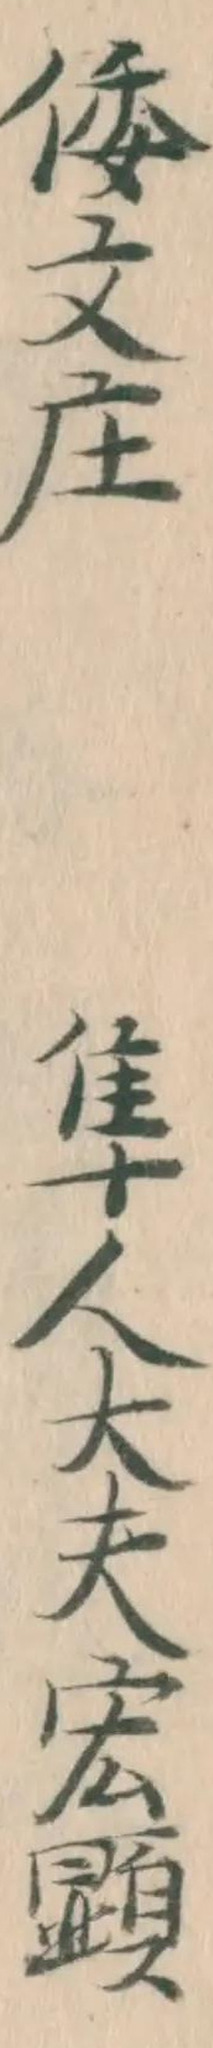倭文庄隼人大夫宏顕
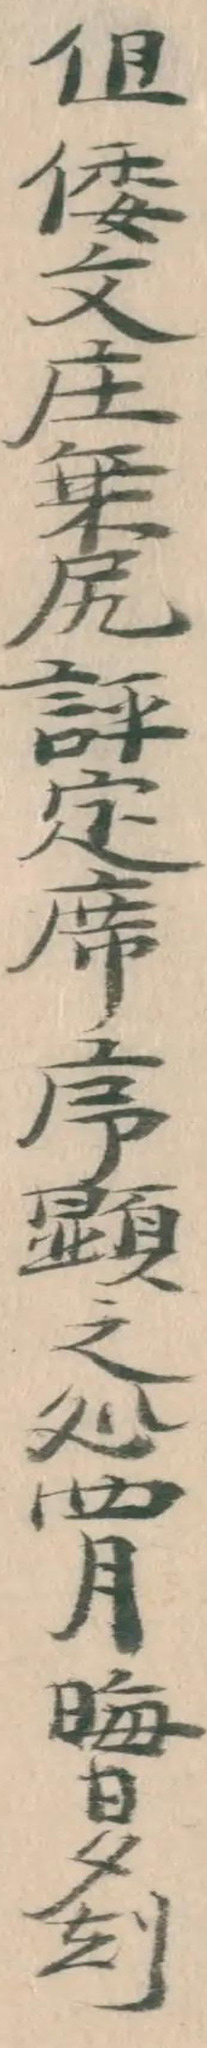但倭文庄乗尻評定席序顕之処四月晦日夕刻
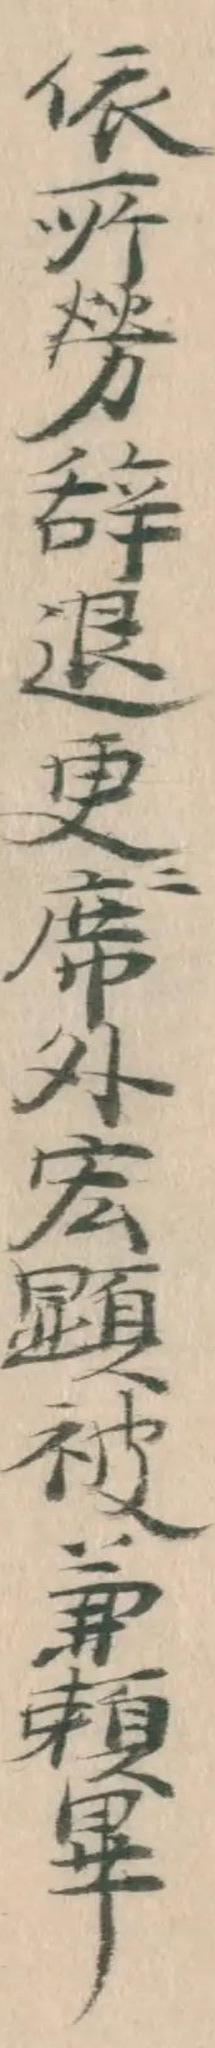依所労辞退更ニ席外宏顕被兼頼畢
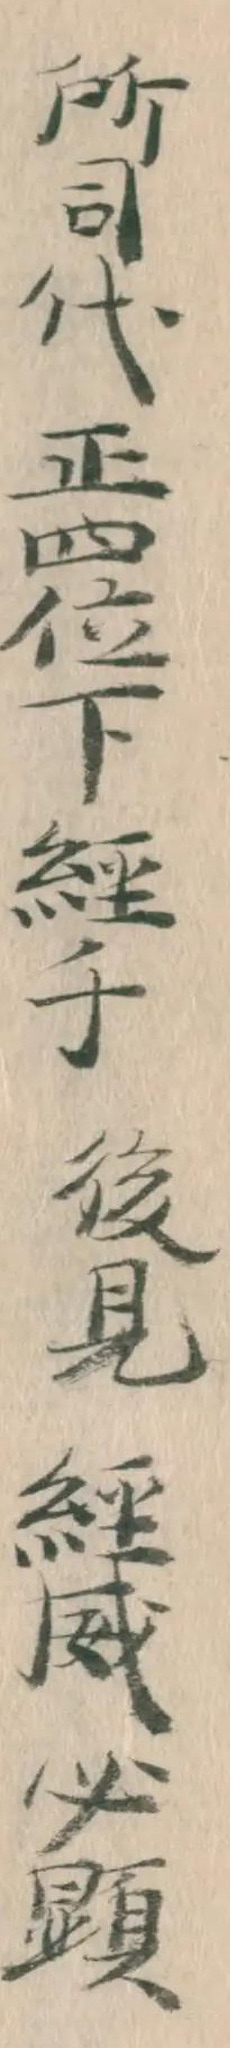所司代正四位下経千後見経威必顕
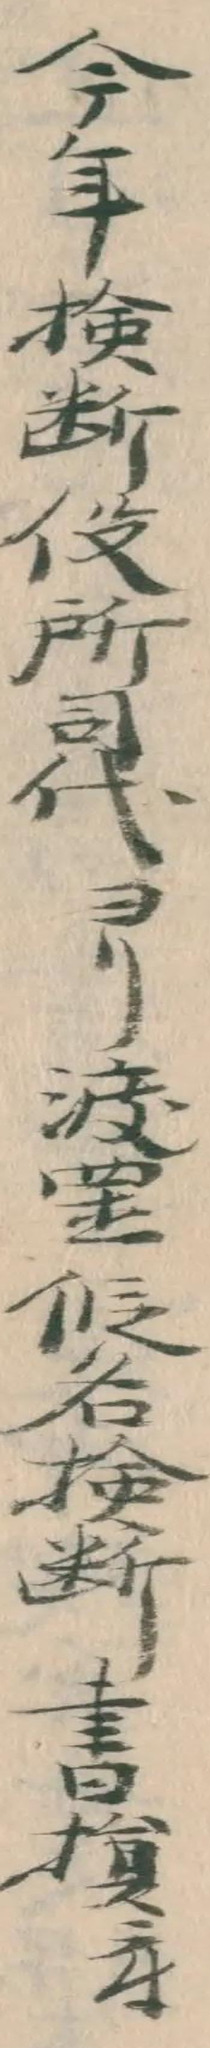今年検断役所司代ヨリ渡置段名検断書損ニ付
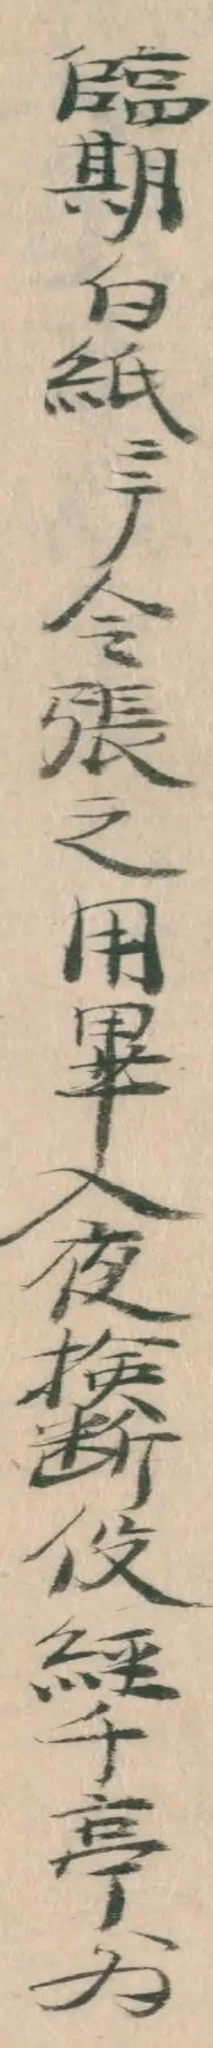臨期白紙ニテ令張之用畢入夜検断役経千亭ヘ為
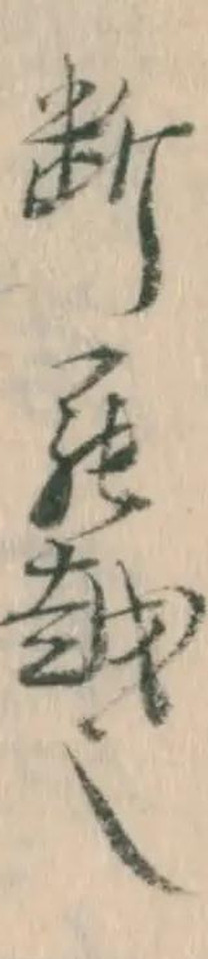断罷越也
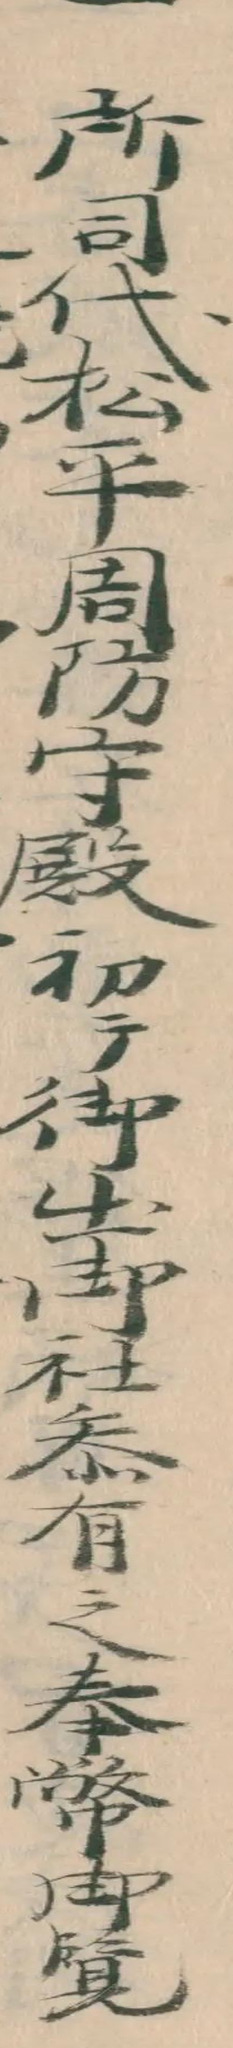一所司代松平周防守殿初テ御出御社参有之奉幣御覧
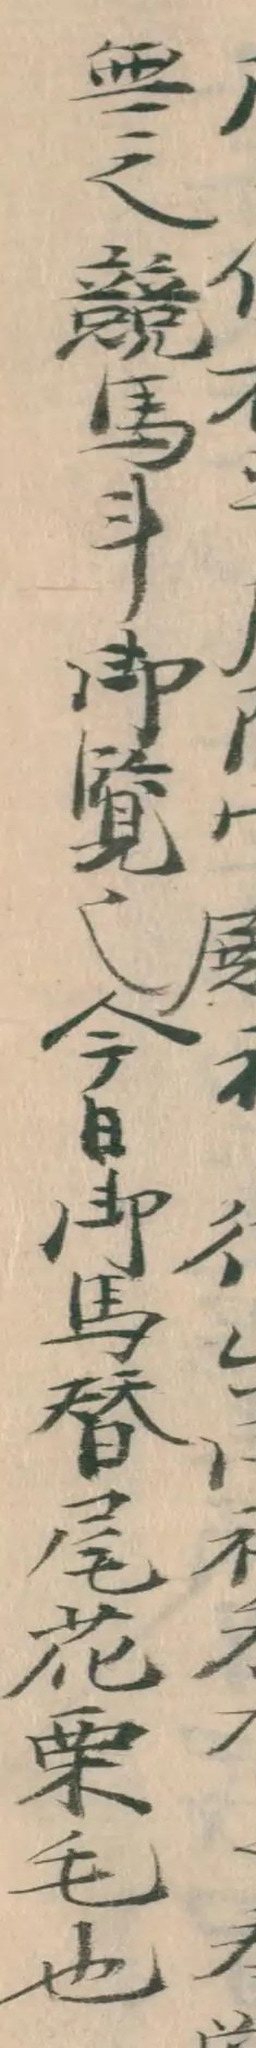無之競馬計御覧也今日御馬替尾花栗毛也
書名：賀茂社記録. 第10冊
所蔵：国立国会図書館 National Diet Library, JAPAN
